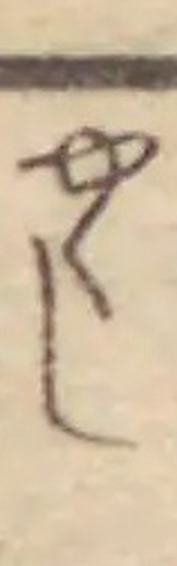やくし
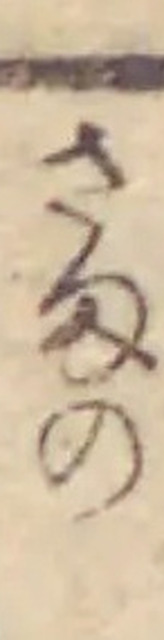さまの
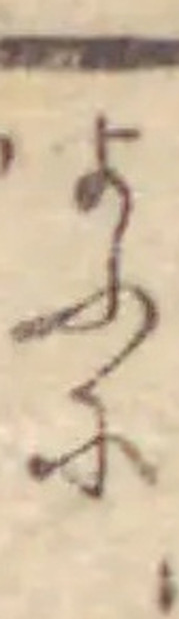よふに
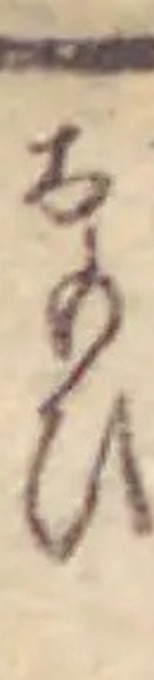おもひ
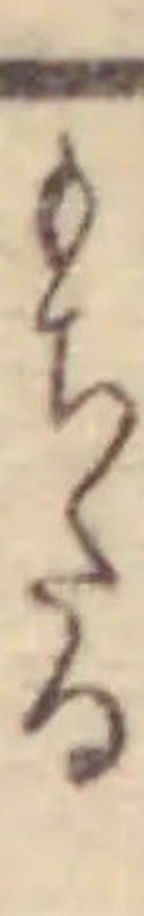もちたる
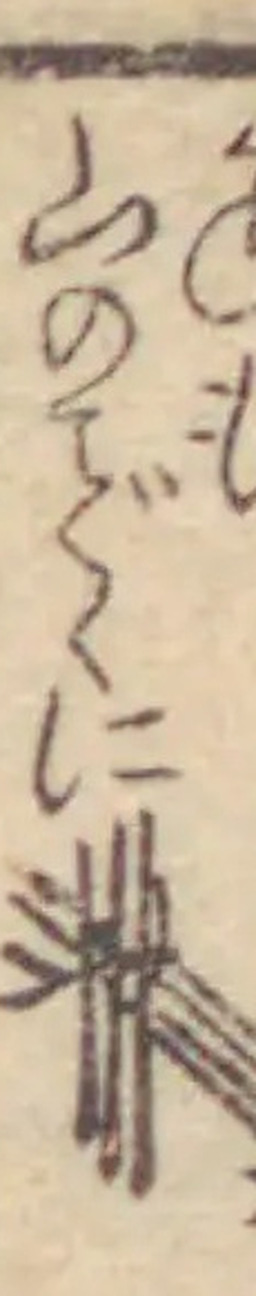山のごとくに
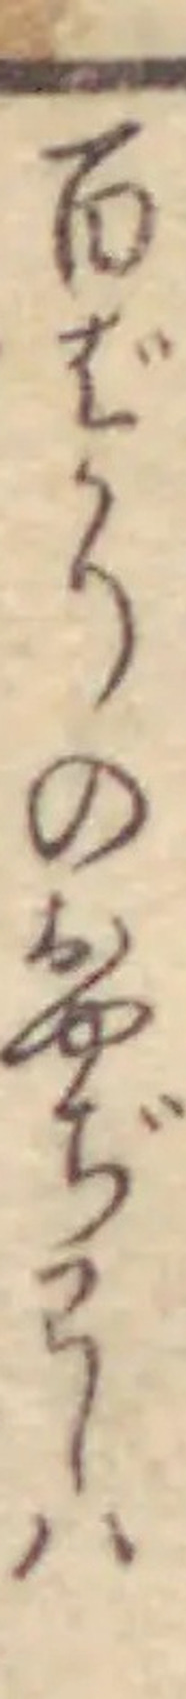百ばかりのおやぢわしは
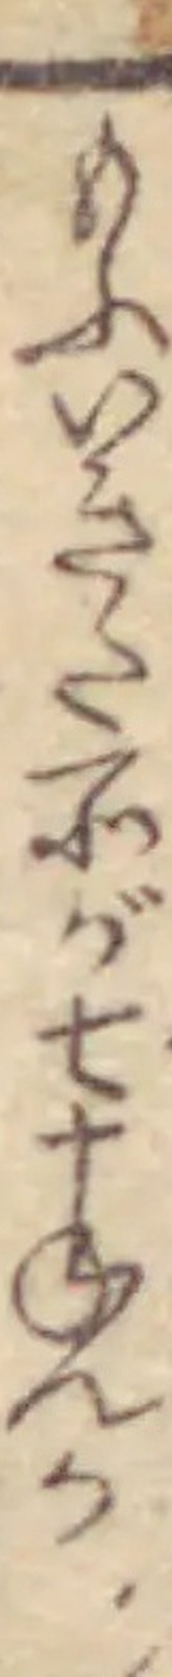もふいきた所が七十ねんか
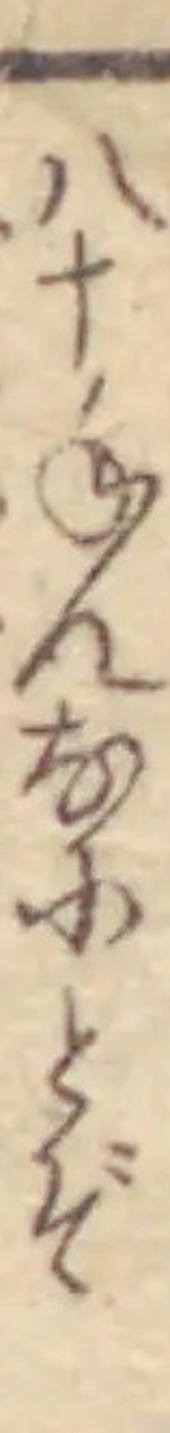八十ねんなにとぞ
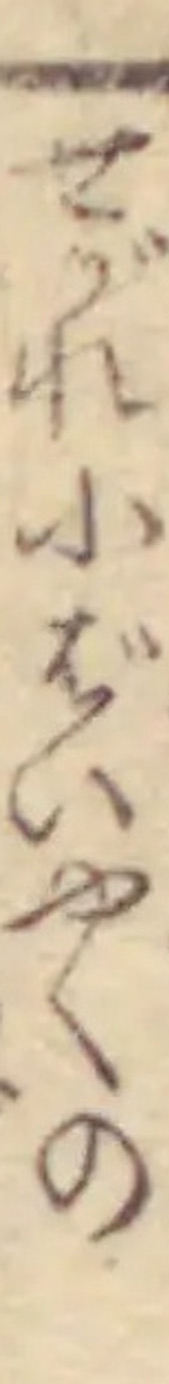せがれにばいやくの
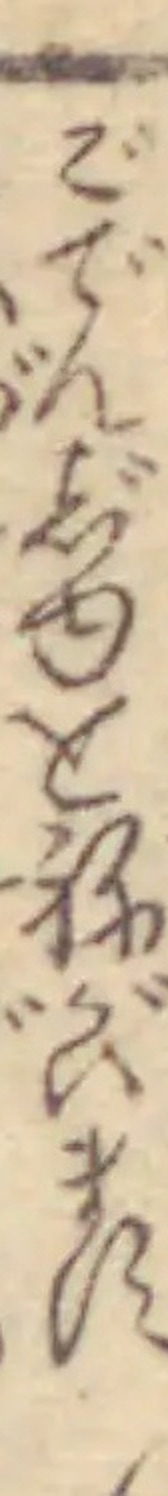ごでんじゆをねがいます
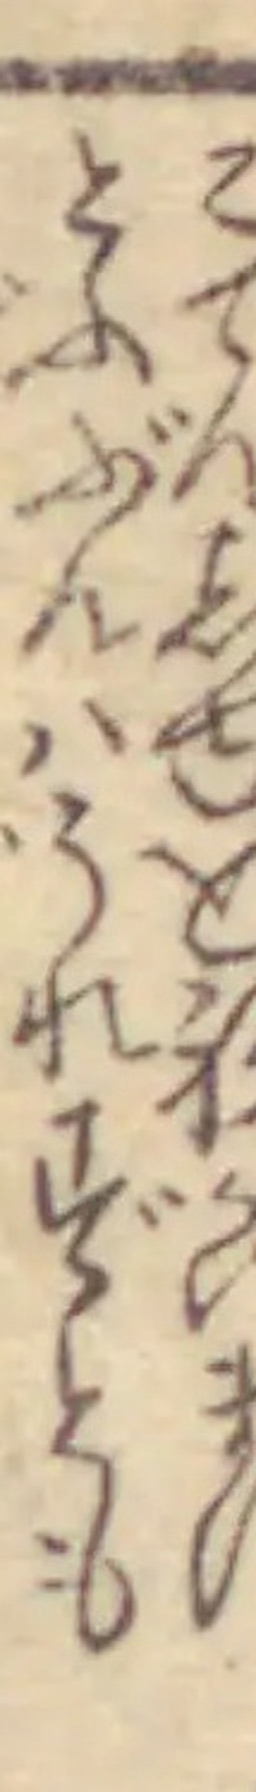とふぶんはうれずとも
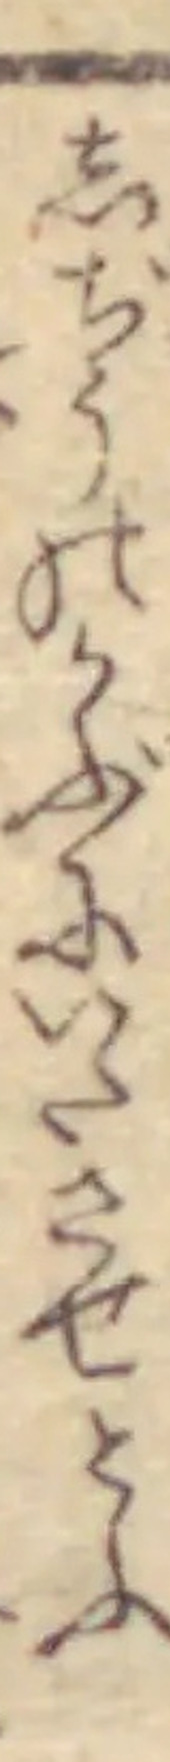しぢうのかぶにいたさせとふ
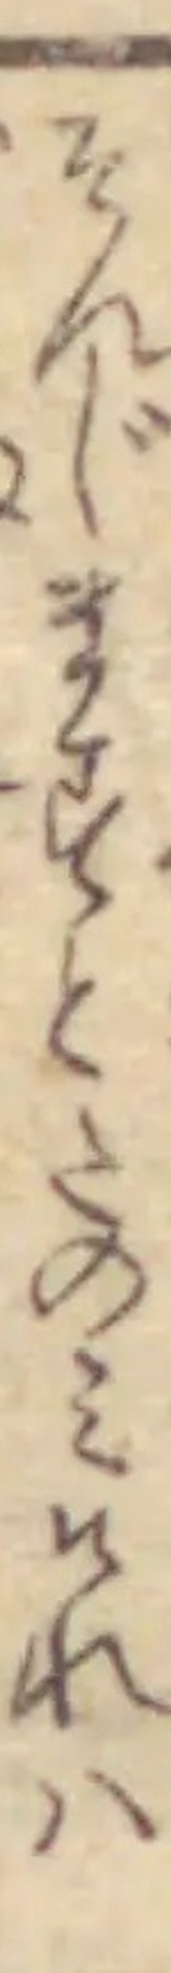そんじますとたのみけれは
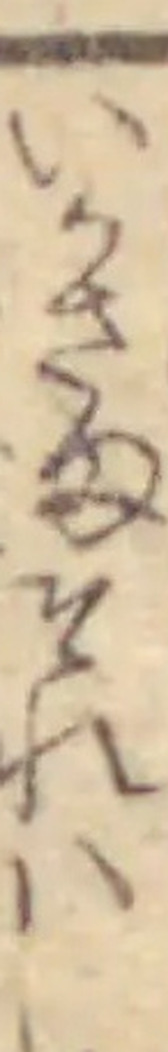いかさまそれは
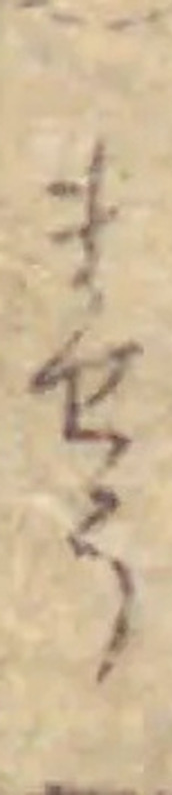ませう
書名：家伝寿命薬 2巻
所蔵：国立国会図書館 National Diet Library, JAPAN
